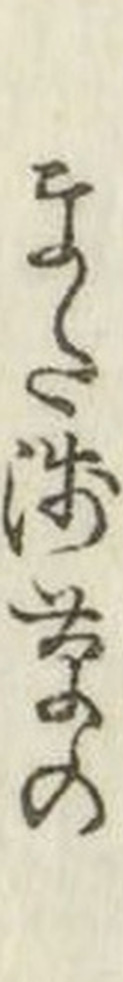また浅草の
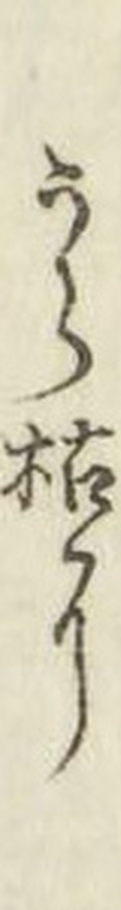うら枯に
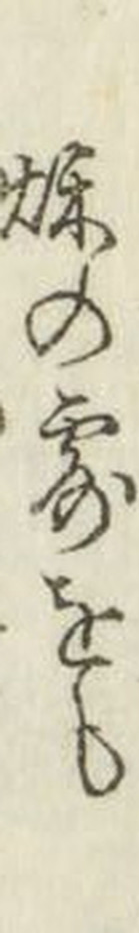秌の露をも
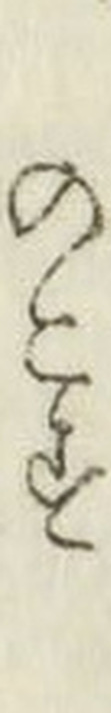のこす
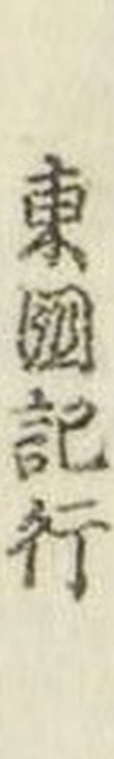東國記行
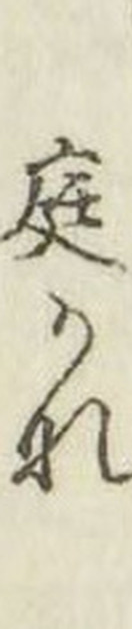庭かれ
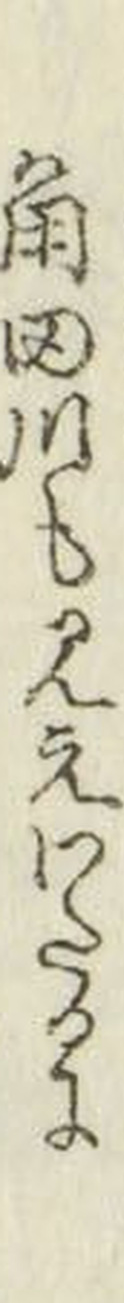角田川も見えわたるに
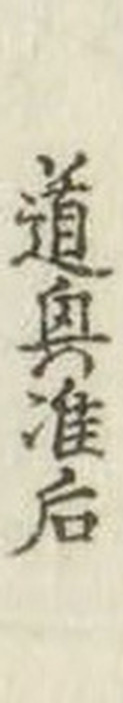道興准后
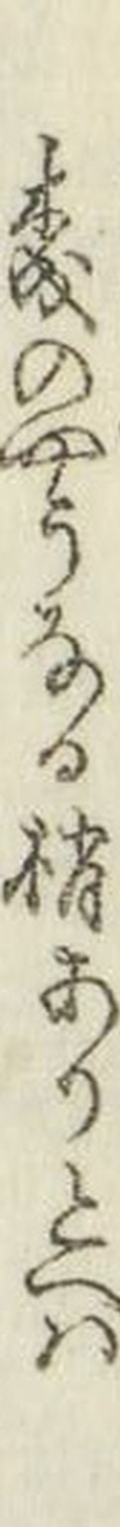森のやうなる梢ありとへは
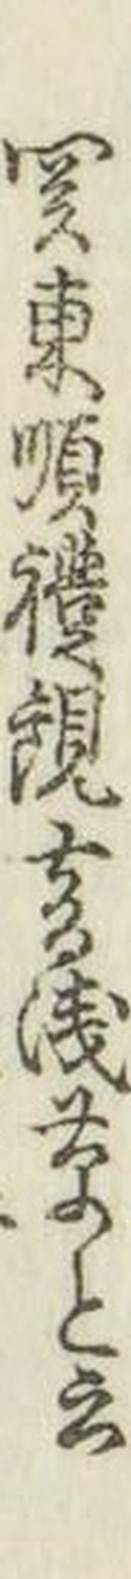関東順禮観音浅草と云
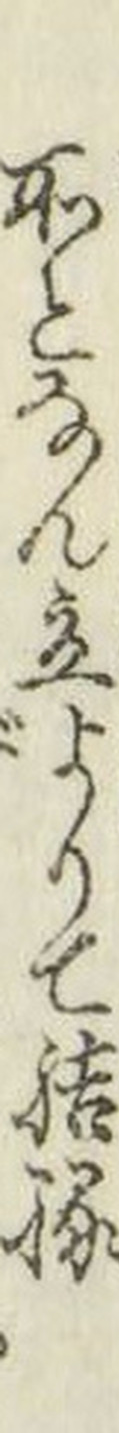所となん立よりて結緣
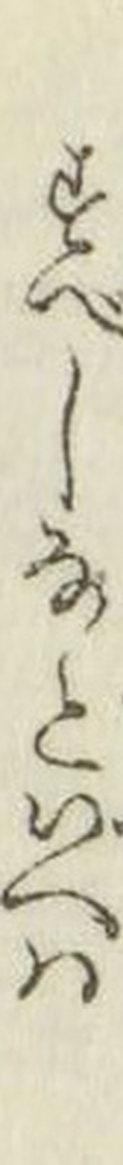すべしなといへは
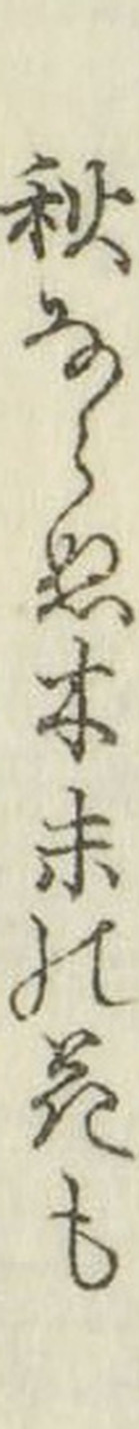秋ならぬ木末の花も
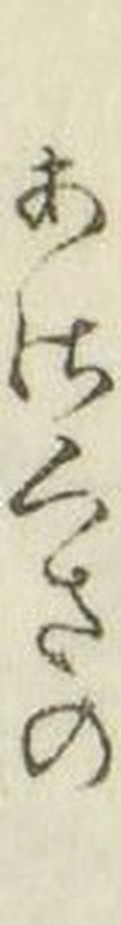あさくさの
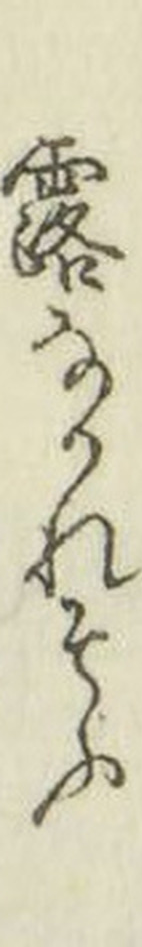露なかれそふ
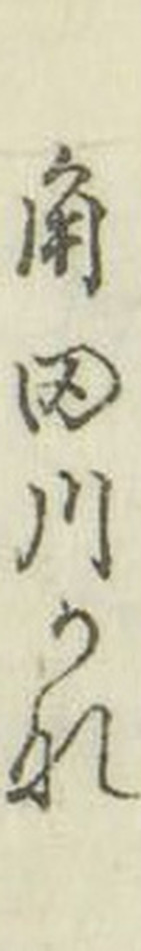角田川かな
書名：江戸名所図会 20巻 巻之16
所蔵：東京学芸大学教育コンテンツアーカイブ
